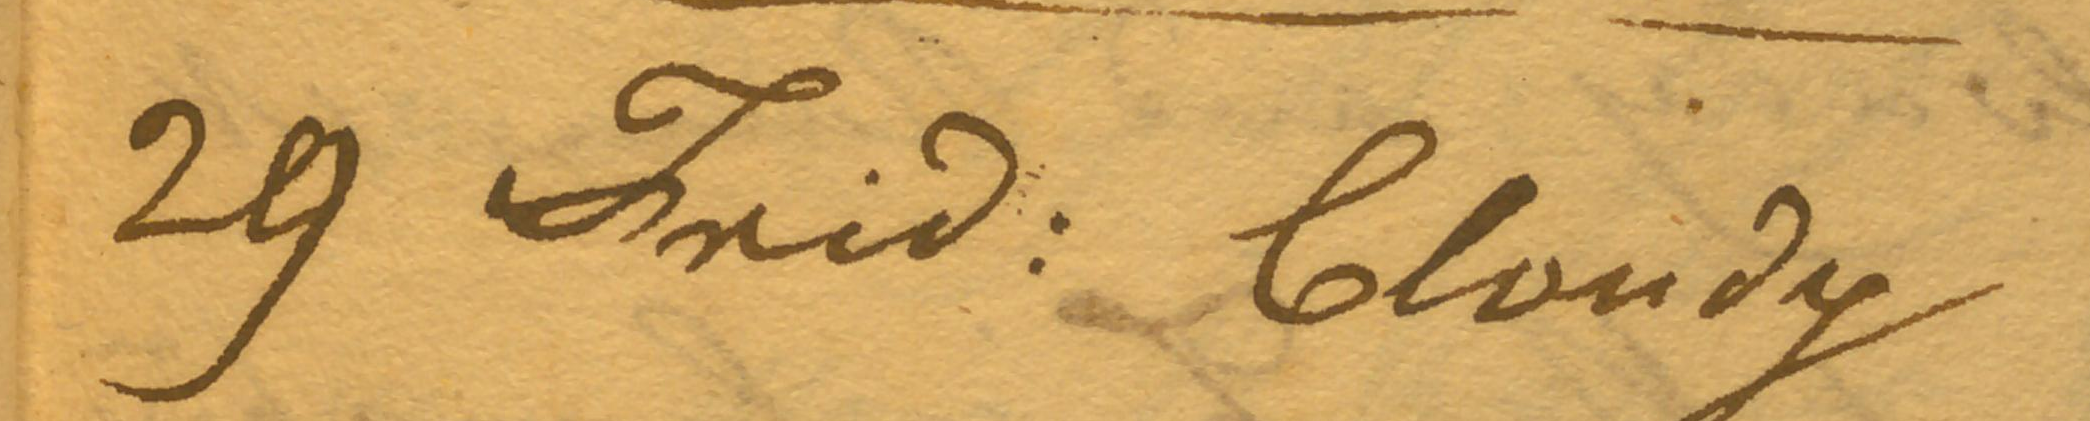29 Frid. Cloudy
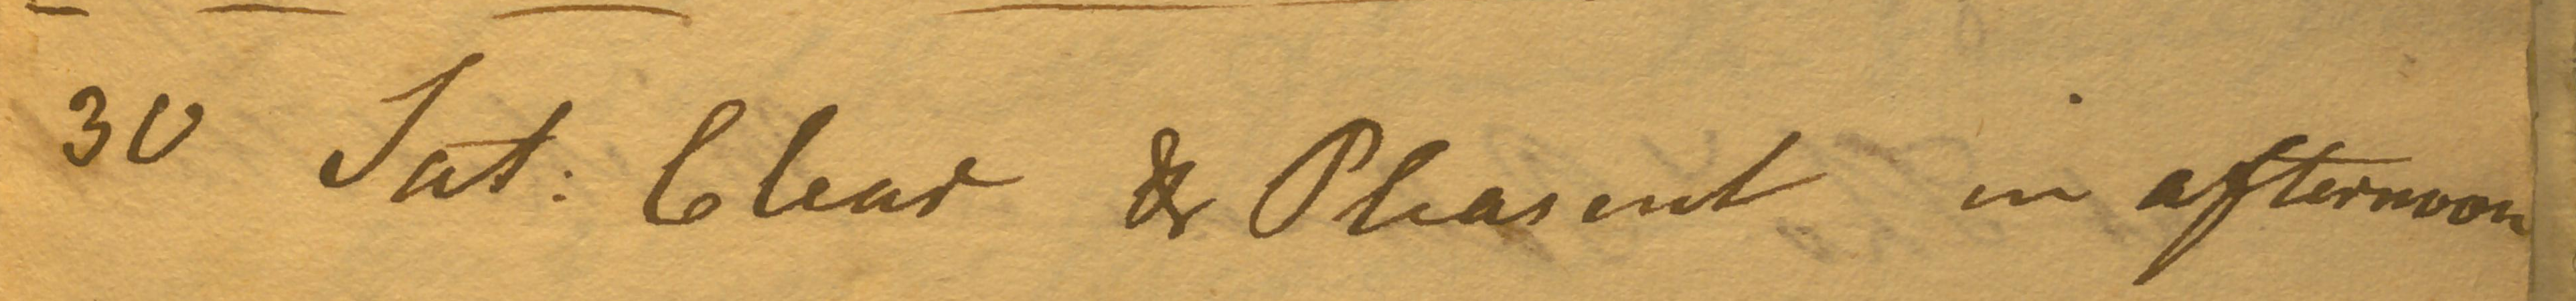30 Sat. Clear & Pleasent in afternoon
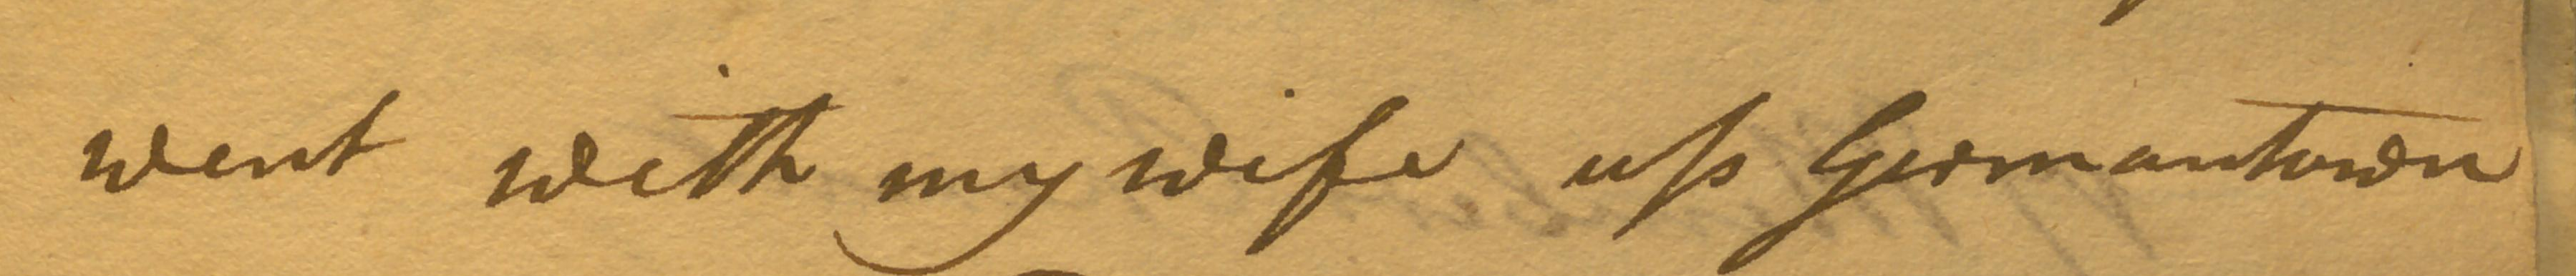went with my wife up Germantown
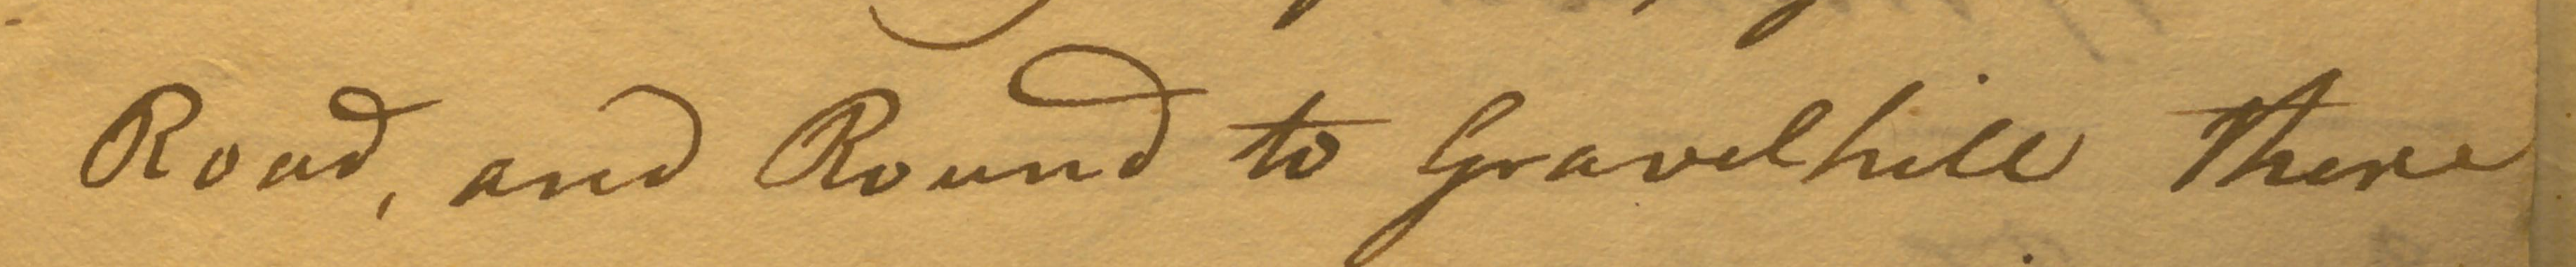Road, and Round to Gravelhill there
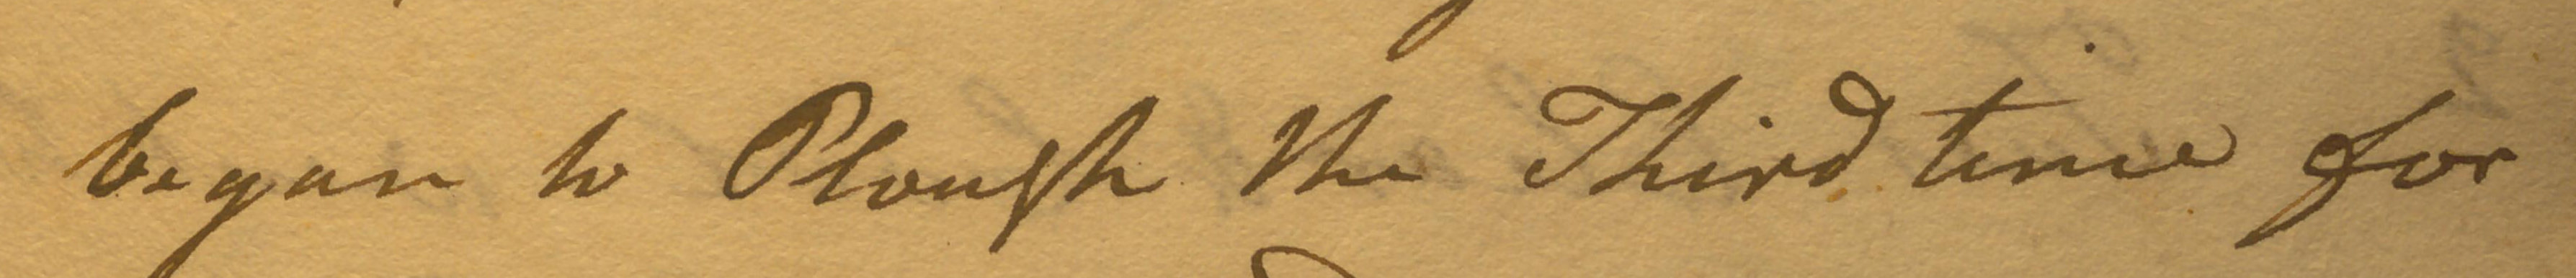began to Plough the Third time for
